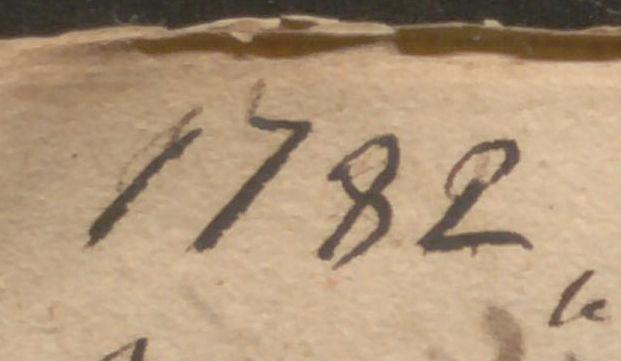1782
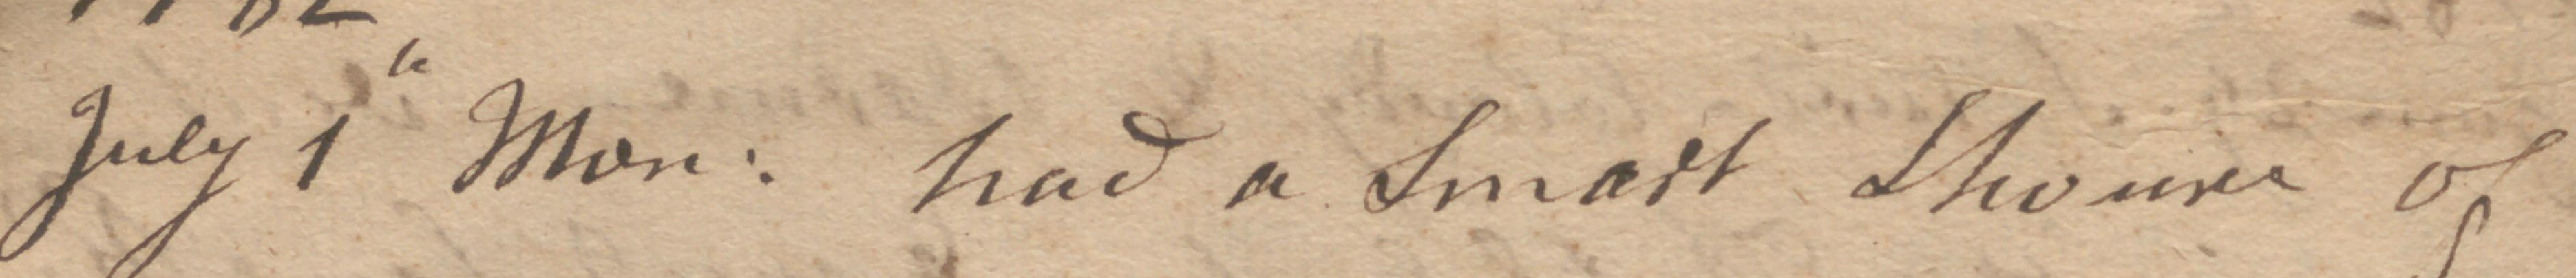July 1 Mon: had a smart Shoure of
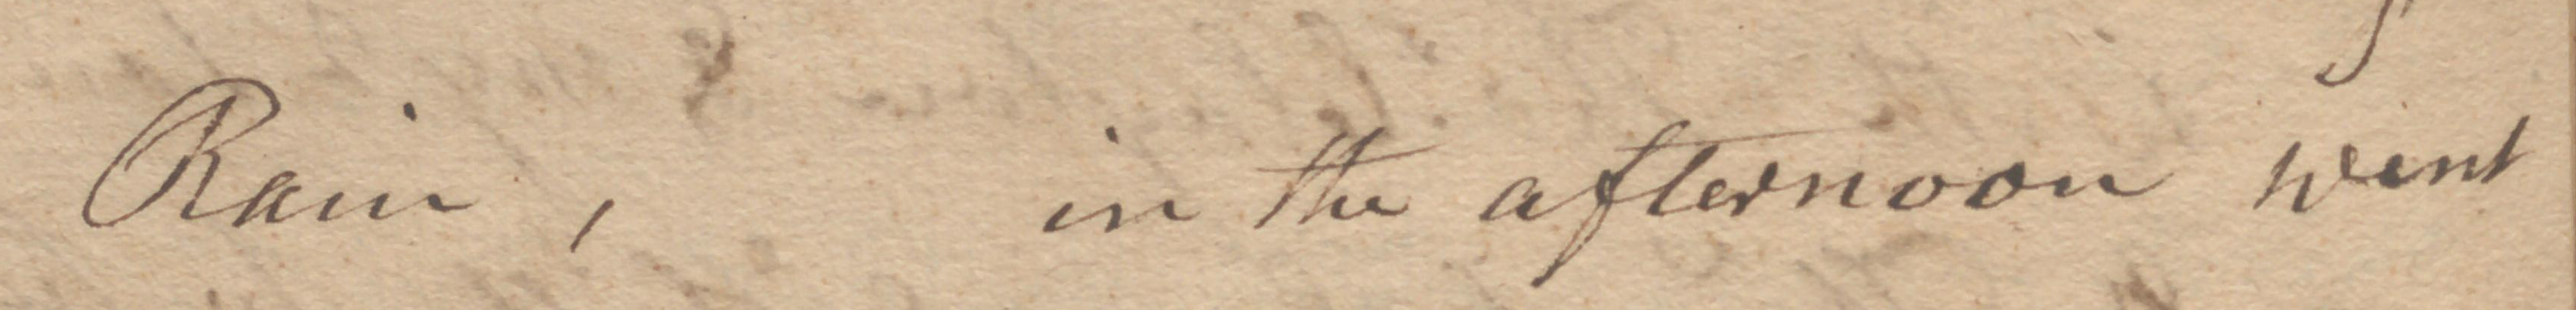Rain, in the afternoon, went
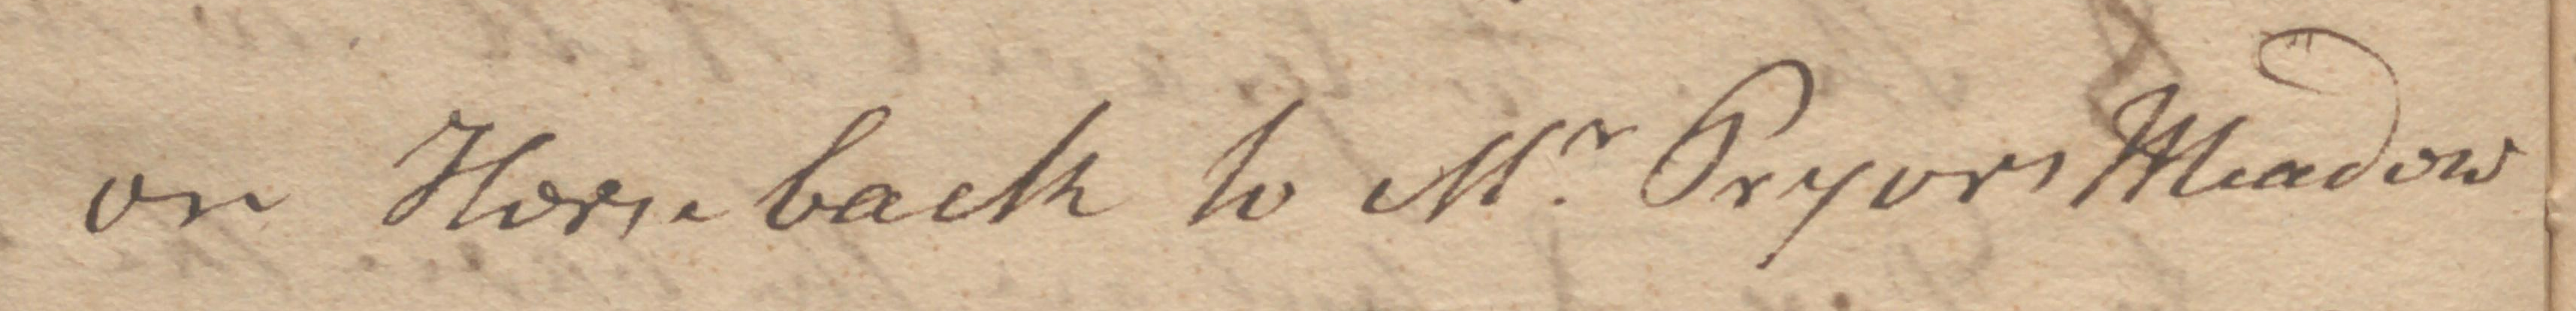on Horseback to M^r. Pryors Meadow
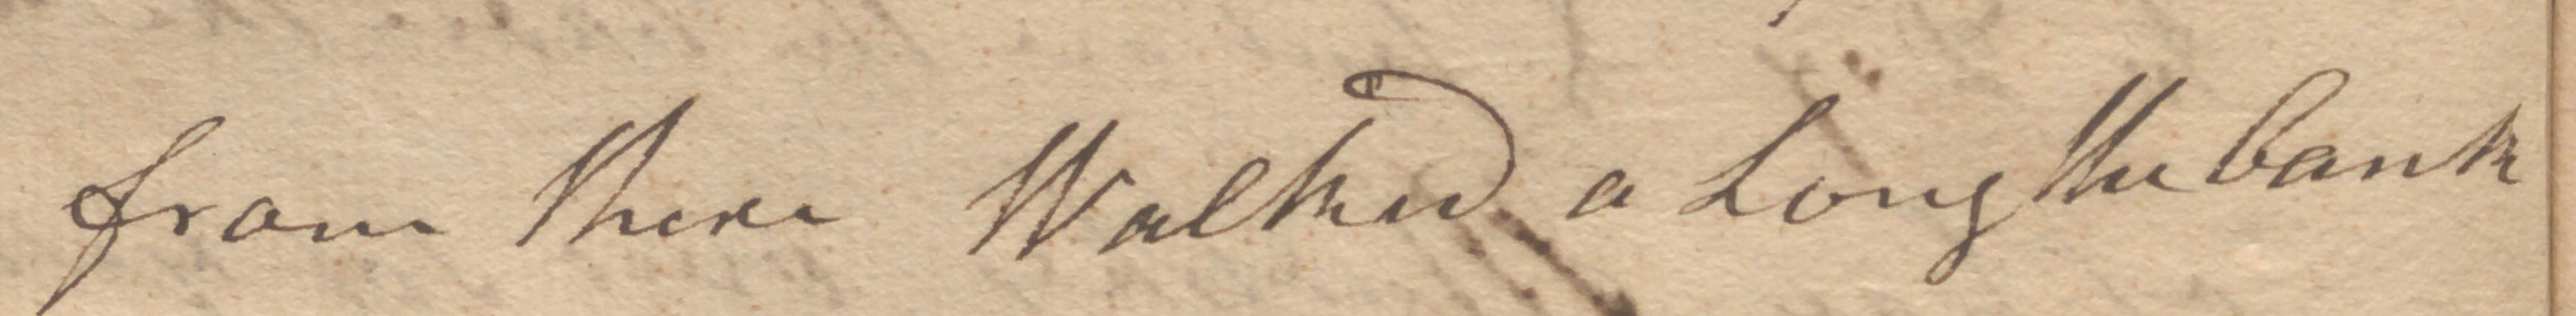from there Walked a Long the bank
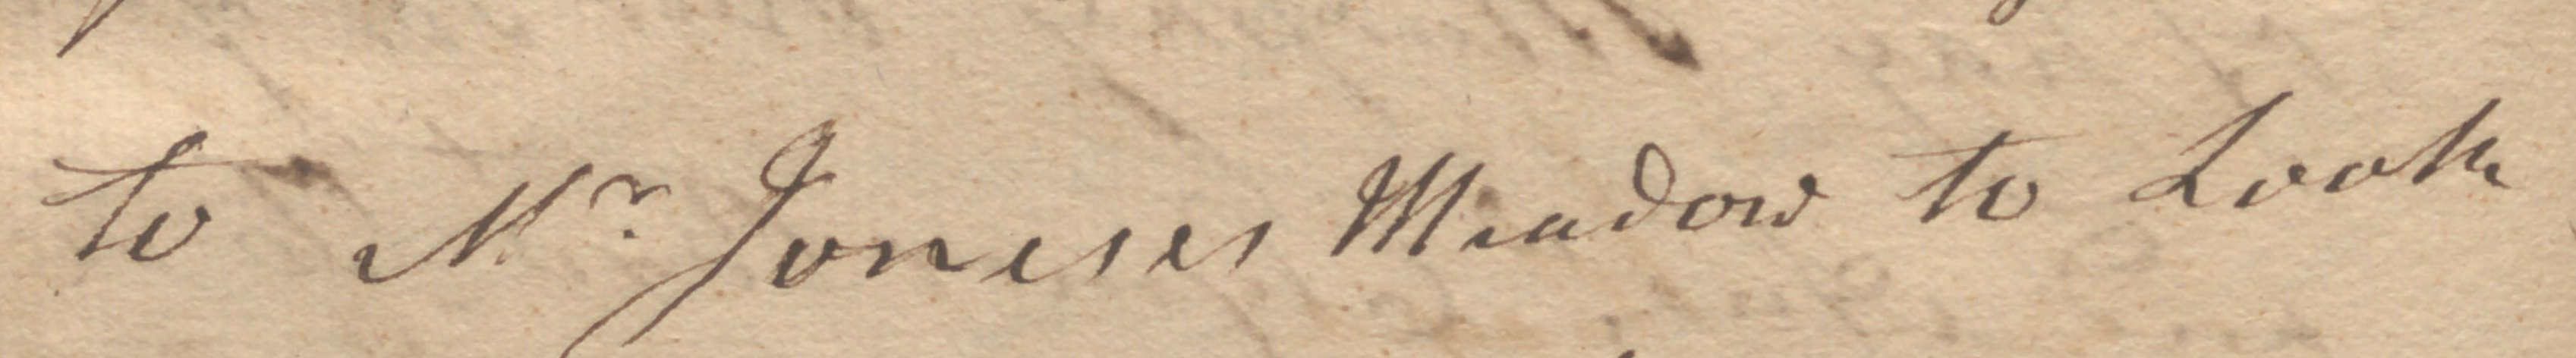to M^r. Joneses Meadow to Look
